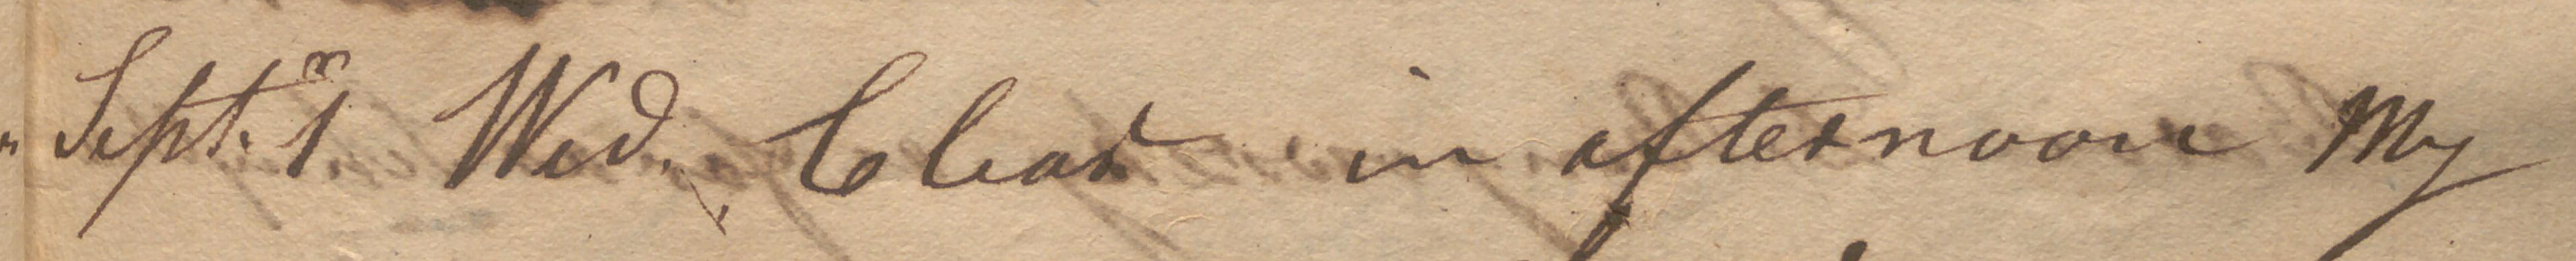Sept^r. 1 Wed Clear in afternoon My
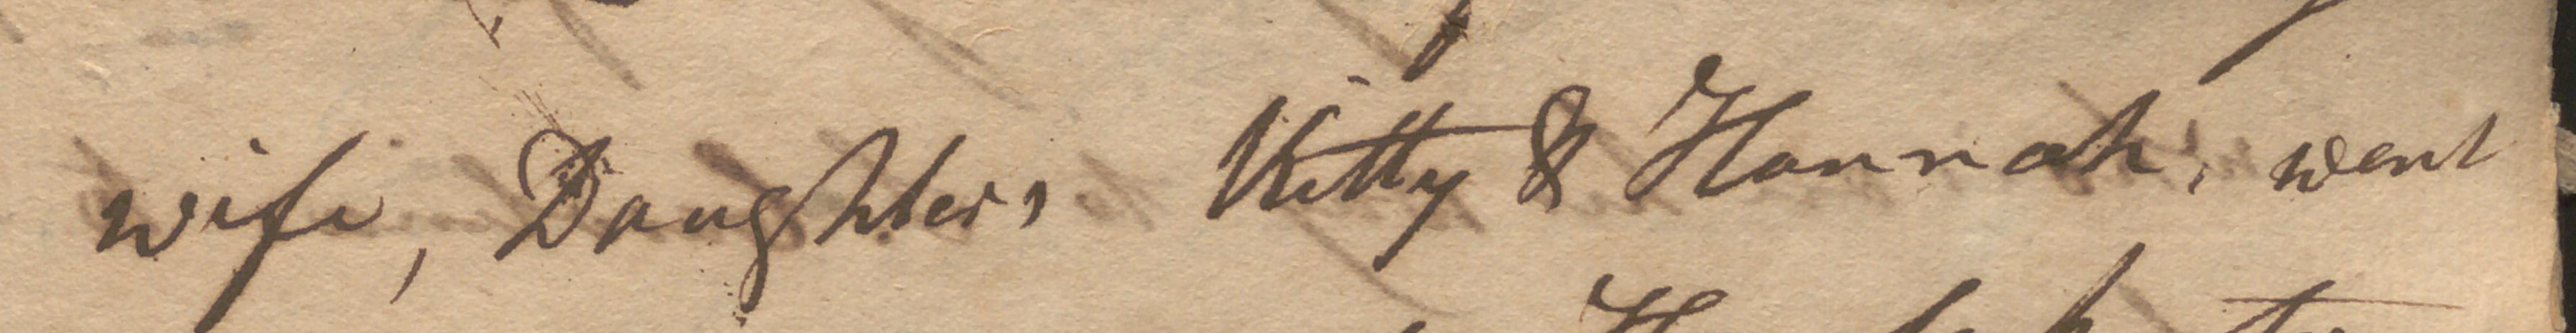wife, Daughters Kitty & Hannah, went
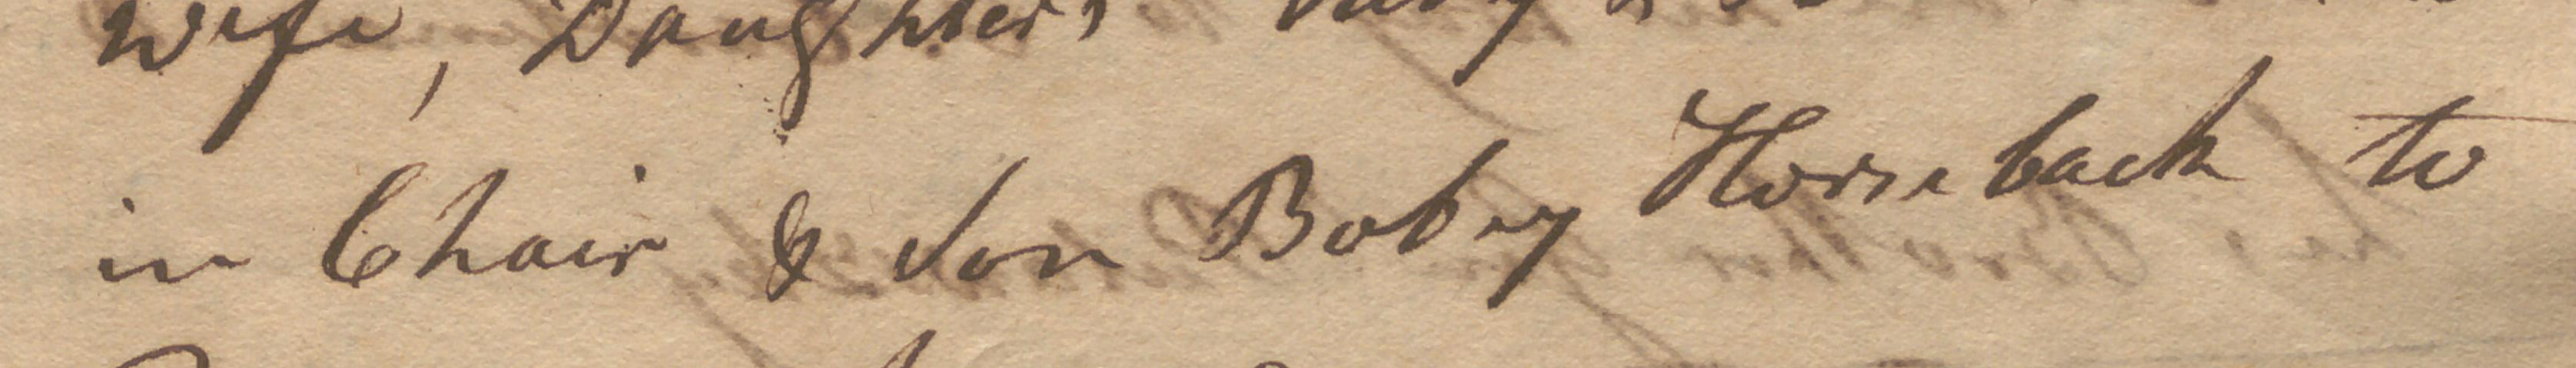in Chair & Son Bobey Horeback to
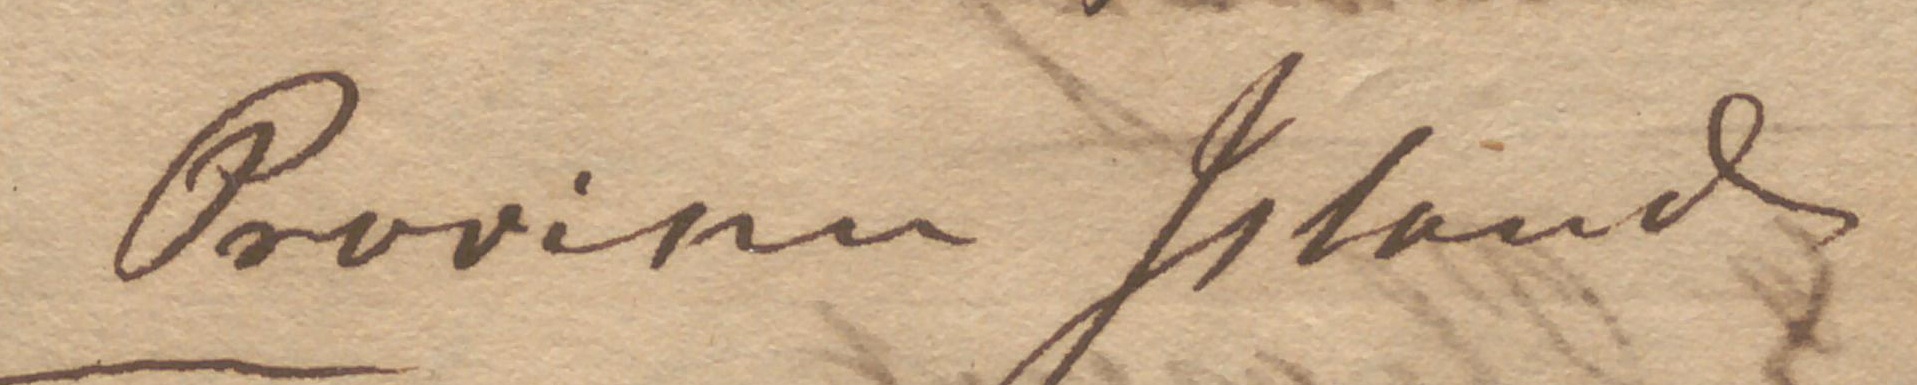Province Island
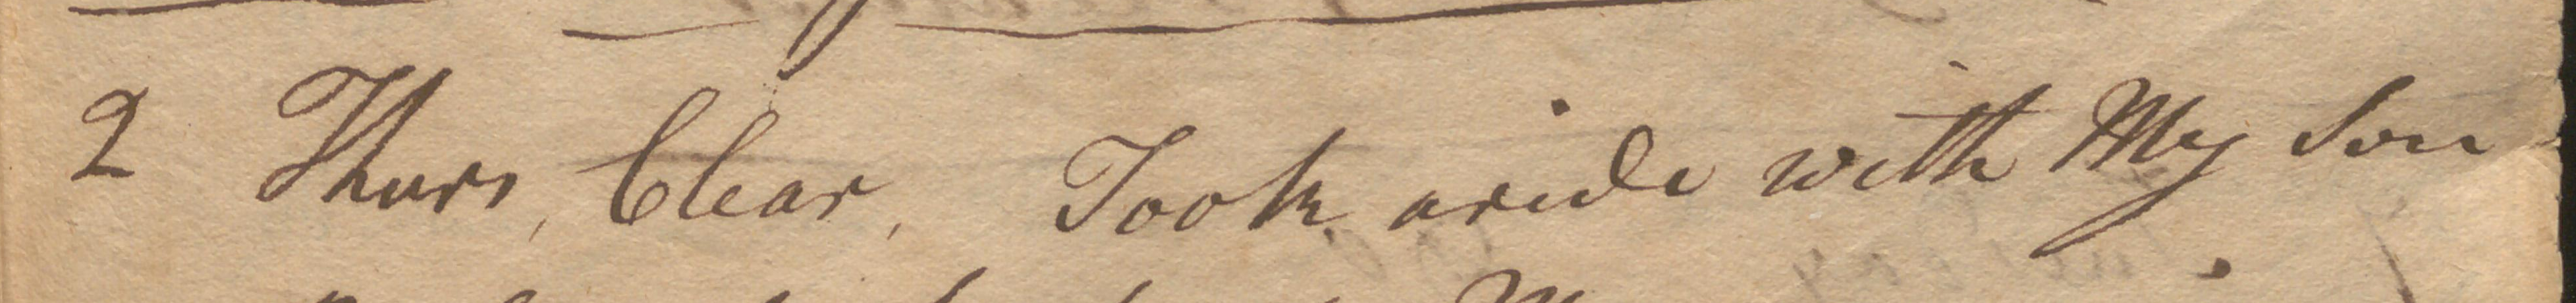2 Thurs Clear Took a ride with My Son
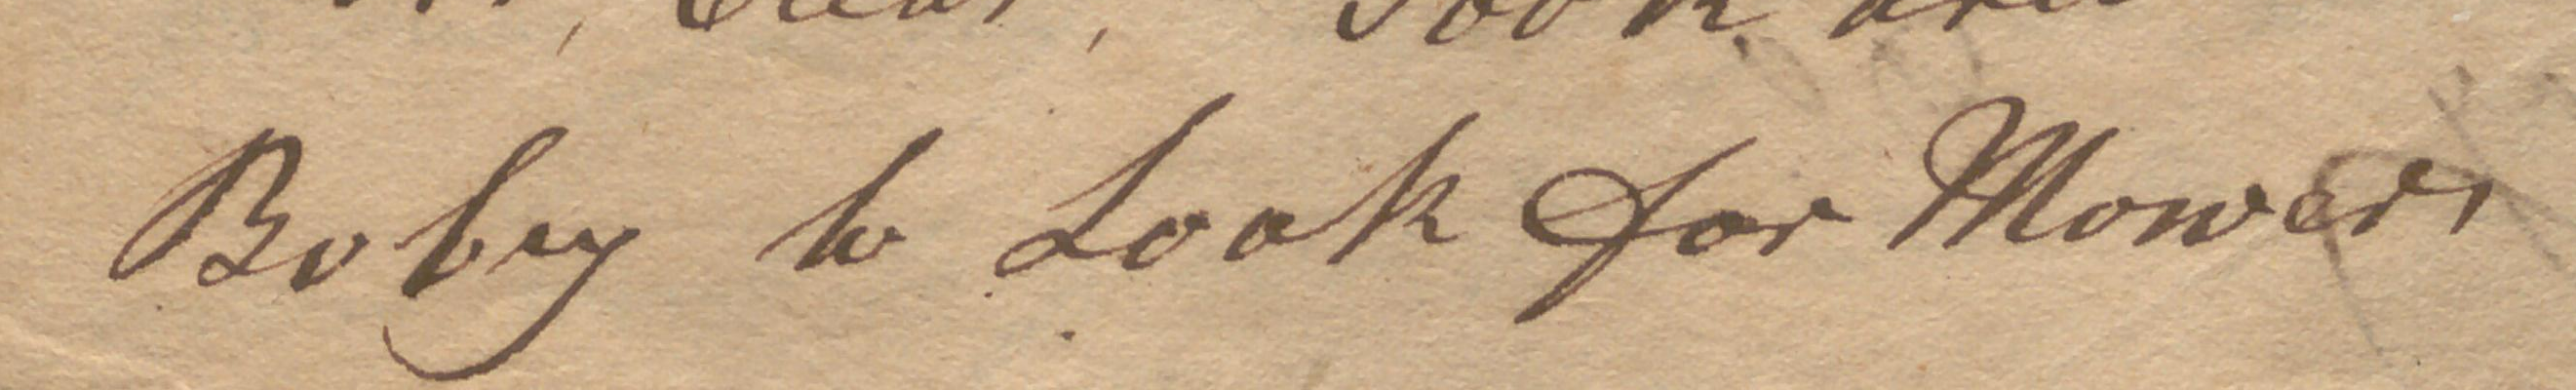Bobey to Look for Mowers
